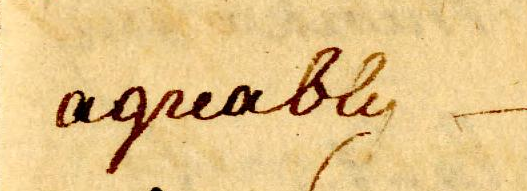agreably
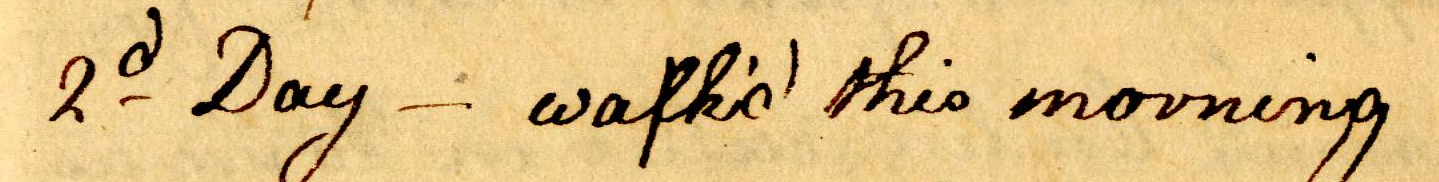2^d Day- walkd this morning
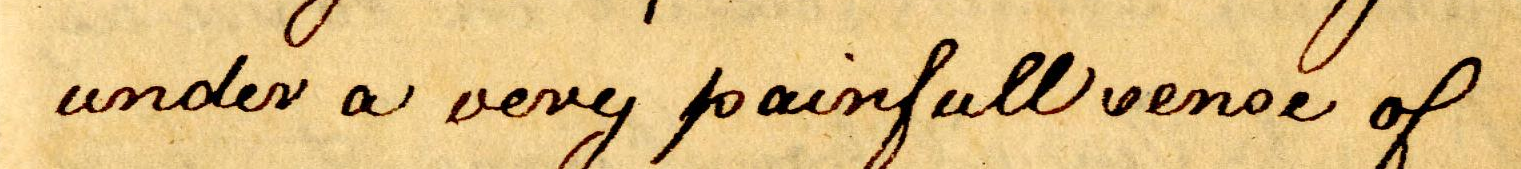under a very painfull sense of
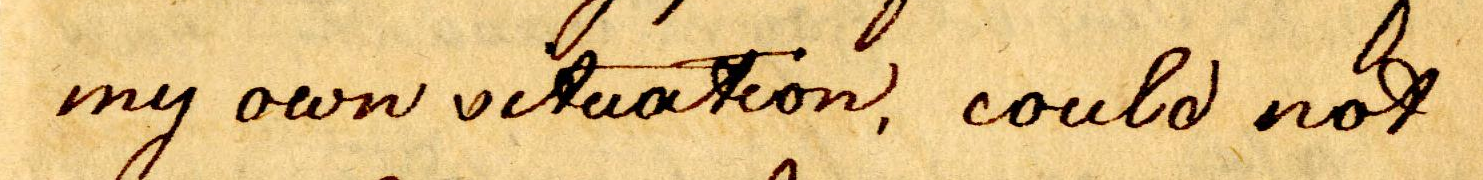my own situation, could not
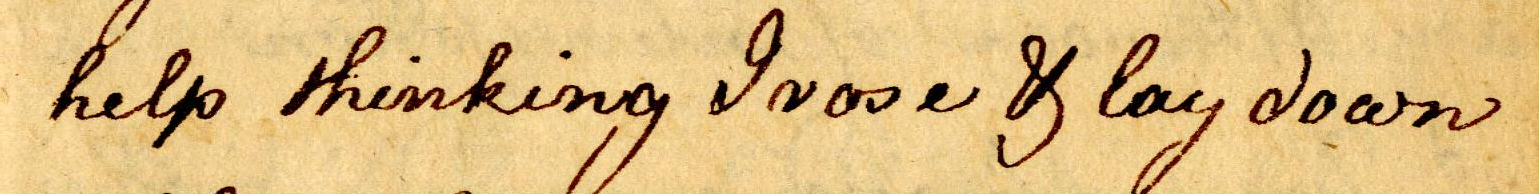help thinking I rose & lay down
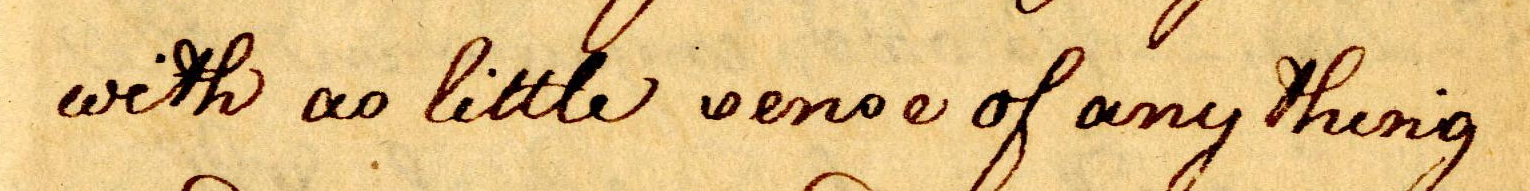with as little sense of any thing
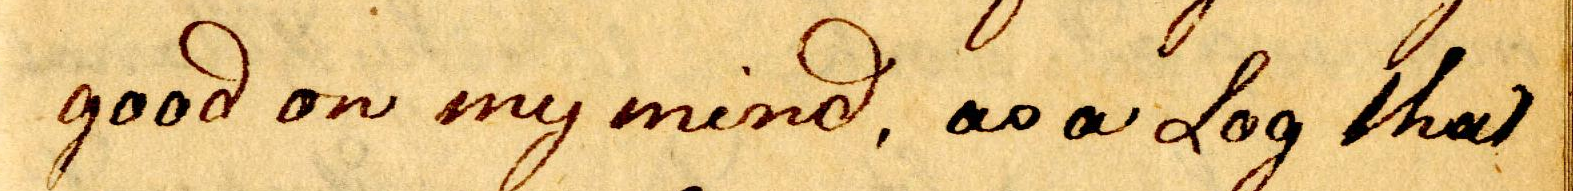good on my mind, as a Log that
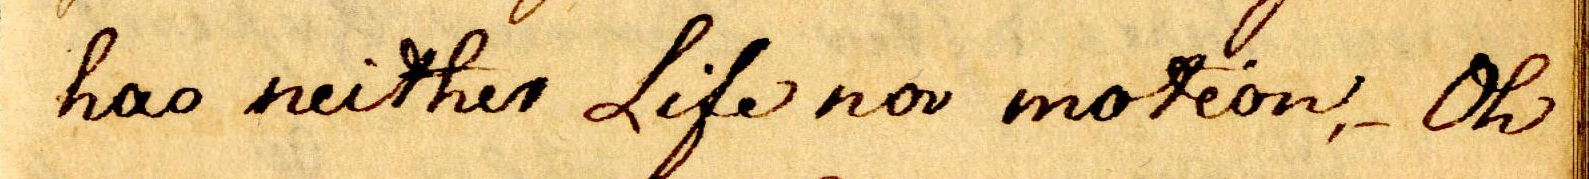has neither Life nor motion,- Oh
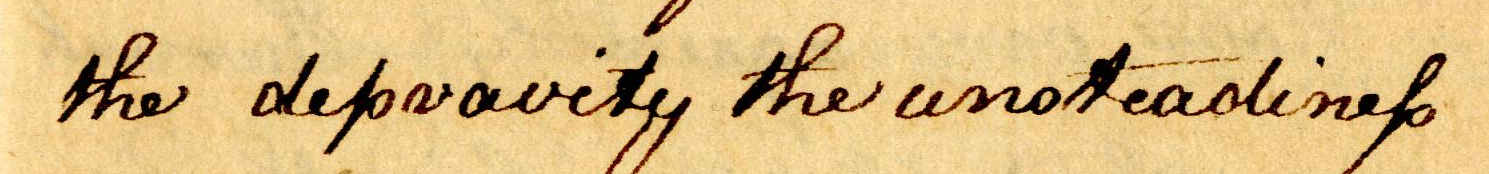the depravity the unsteadiness
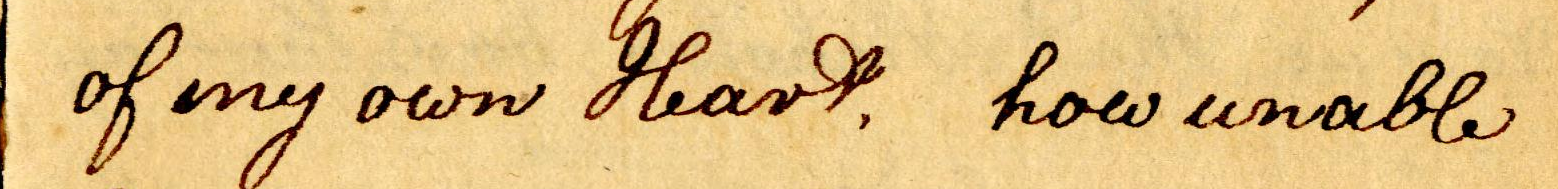of my own Heart, how unable
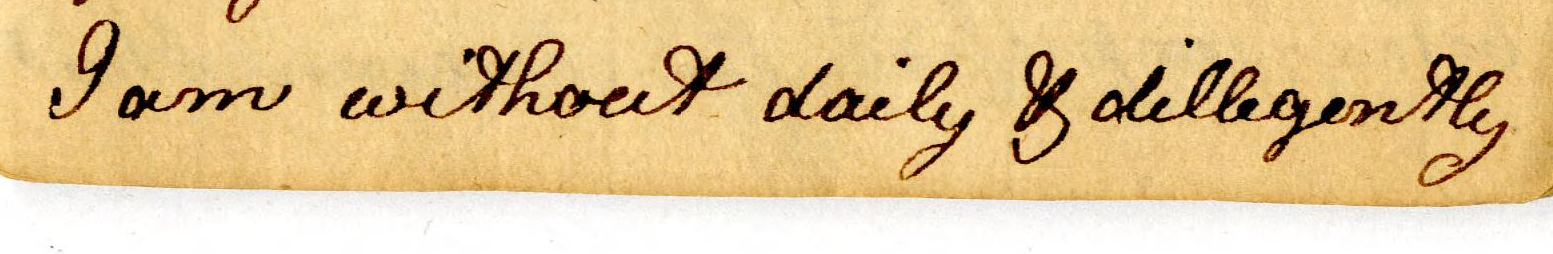I am without daily & dillegently
